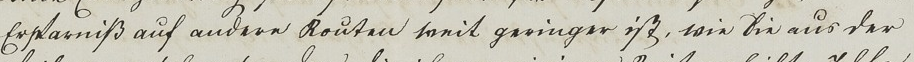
Ersparniß auf andern Routen weit geringer ist, wie Sie aus der
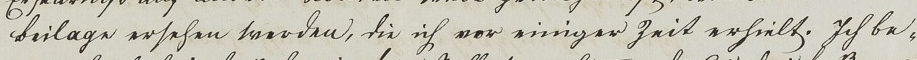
Beilage ersehen werden, die ich vor einiger Zeit erhielt. Ich be-
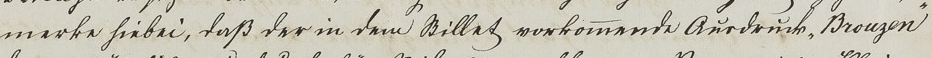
merke hiebei, daß der in dem Billet vorkommende Ausdruck «Brouzen»
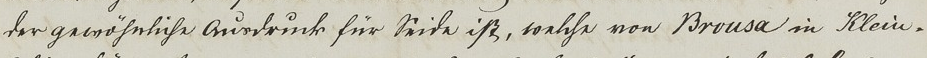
der gewöhnliche Ausdruck für Seide ist, welche von Brousa in Klein-
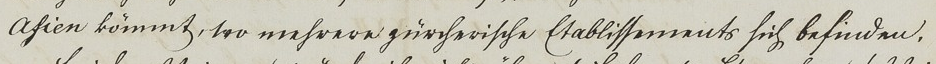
Asien kömmt, wo mehrere zürcherische Etablissements sich befinden.
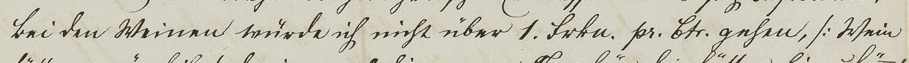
Bei den Weinen würde ich nicht über 1. Frkn. pr. Ctr. gehen, (Wein
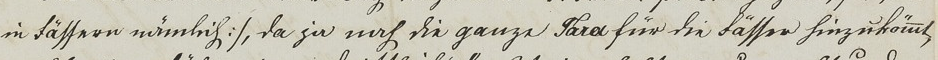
in Fässern nämlich), da ja noch die ganze Tara für die Fässer hinzukömmt,
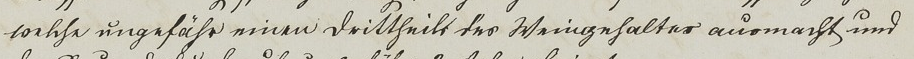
welche ungefähr einen Drittheil des Weingehaltes ausmacht und
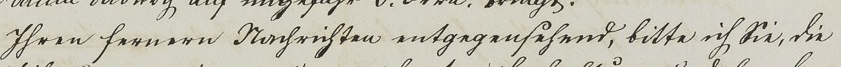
Ihren fernern Nachrichten entgegensehend, bitte ich Sie, die
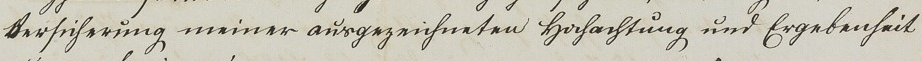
Versicherung meiner ausgezeichneten Hochachtung und Ergebenheit
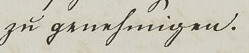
zu genehmigen.
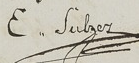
Ed Sulzer
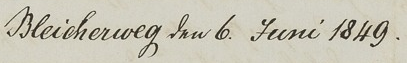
Bleicherweg den 6. Juni 1849.
